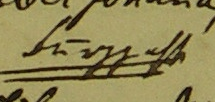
Burggasse
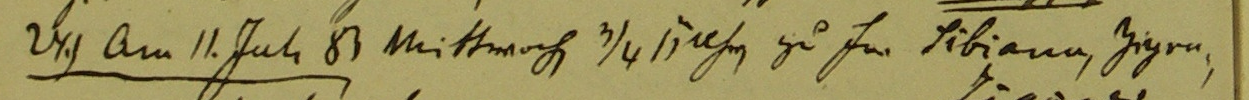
24. Am 11. Juli 83, Mittwoch, ¾ 11 Uhr, zu Fr. Sibiana, Zigäu¬
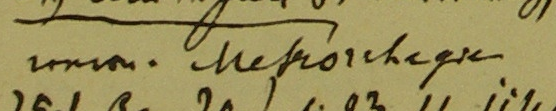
nerin, Metrochegarie
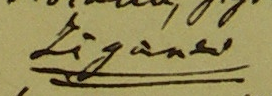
Liganer
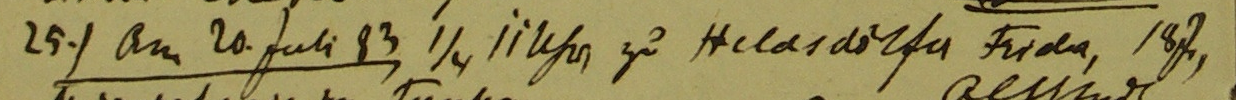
25. Am 20 Juli 83, ¼ 11 Uhr, zu Helsdörfer Frida, 18 J.
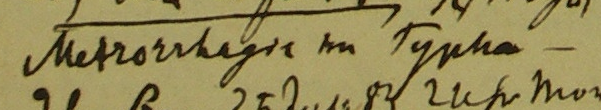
Metrorherahie und Typhus
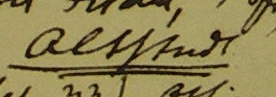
Altstadt
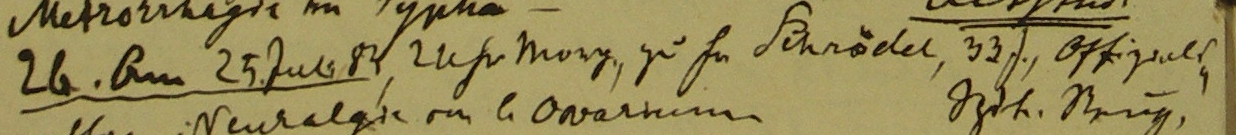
26. Am25 Juli 83, 2 Uhr morg., zu Fr. Schröder 33 J., Offiziers¬
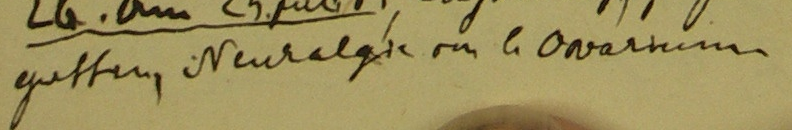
gattin, Neuralgie im l. Ovarium
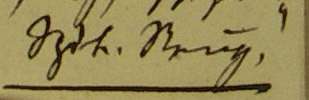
Spit. Neug.
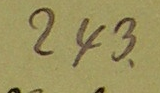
243
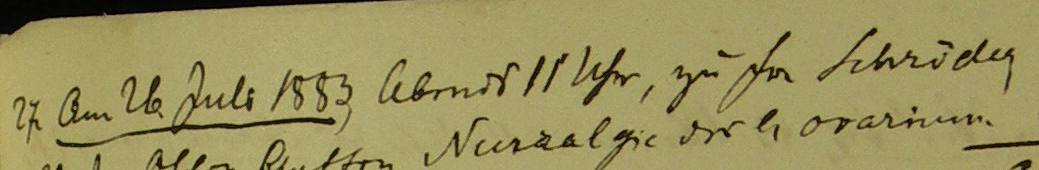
27. Am 26 Juli 1883, Abends 11 Uhr, zu Fr. Schröder
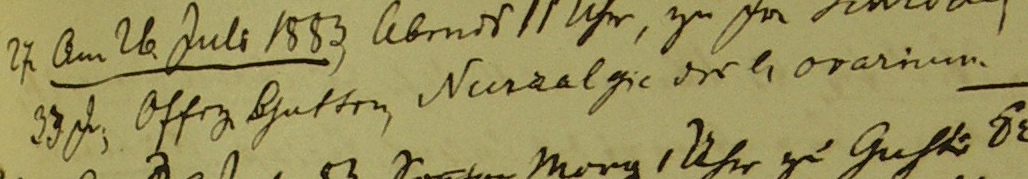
33 J. Offiz. Gattin,. Neuralgie der l. Ovarium
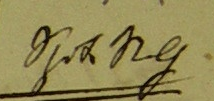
Spit Ring
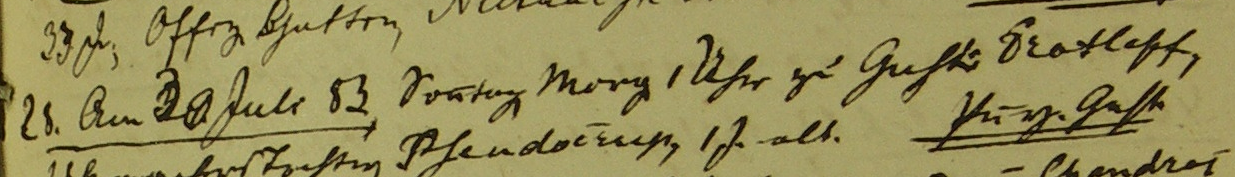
28. Am 30. Juli 83, Sonntag Morgen, 1 Uhr, zu Gusti Drotleff,
